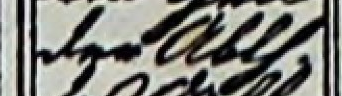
der Abthg
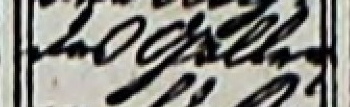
des Göller
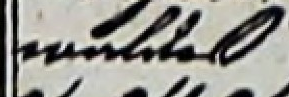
waldes
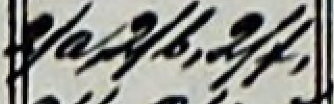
2/a, 2/b, 2/f,
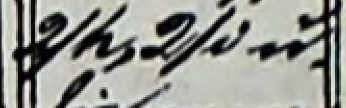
2/h, 2/d u.
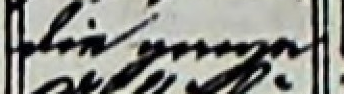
die ganze
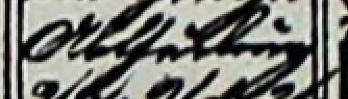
Abtheilung
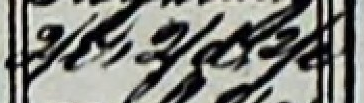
2/c, 2/d, 2/e
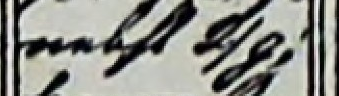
nebst 2/g,
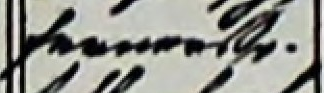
ferners v.
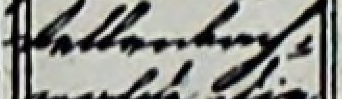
Dettenbach„
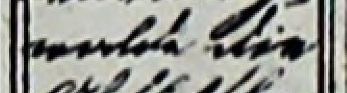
walde die
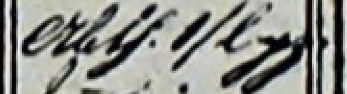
Abth. 1/l gg
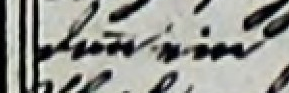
dann ein
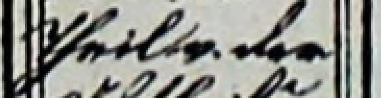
Theil v. der
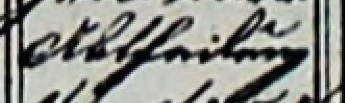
Abtheilung
